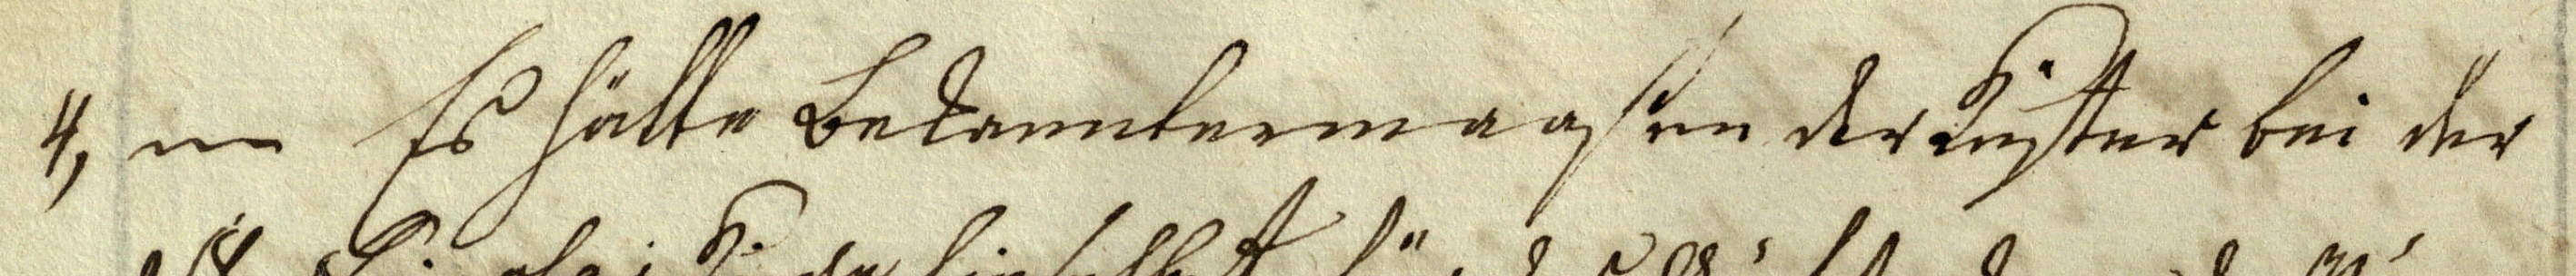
4, es hätte bekanntermaaßen der Küster bei der
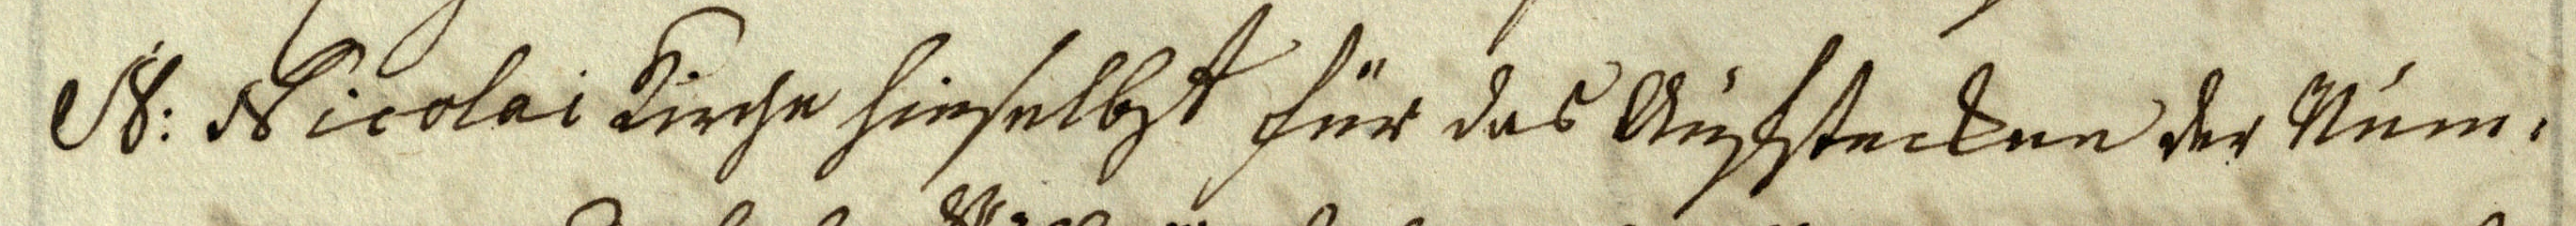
St. Nicolai Kirche hieselbst für das Aufstecken der Num¬
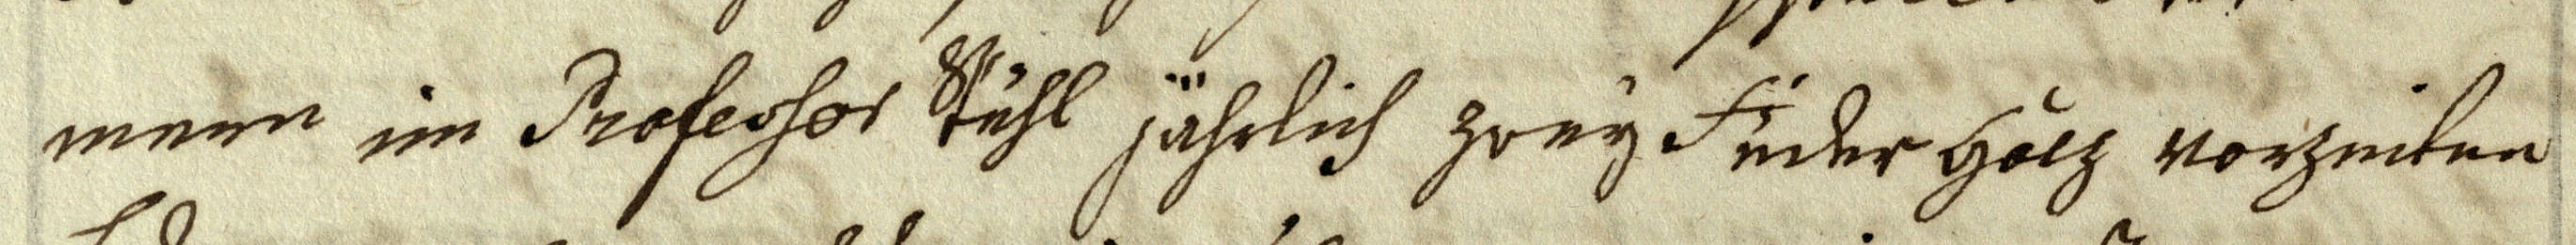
mern im Professor Stuhl jährlich zweÿ Fuder Holz vorzeiten
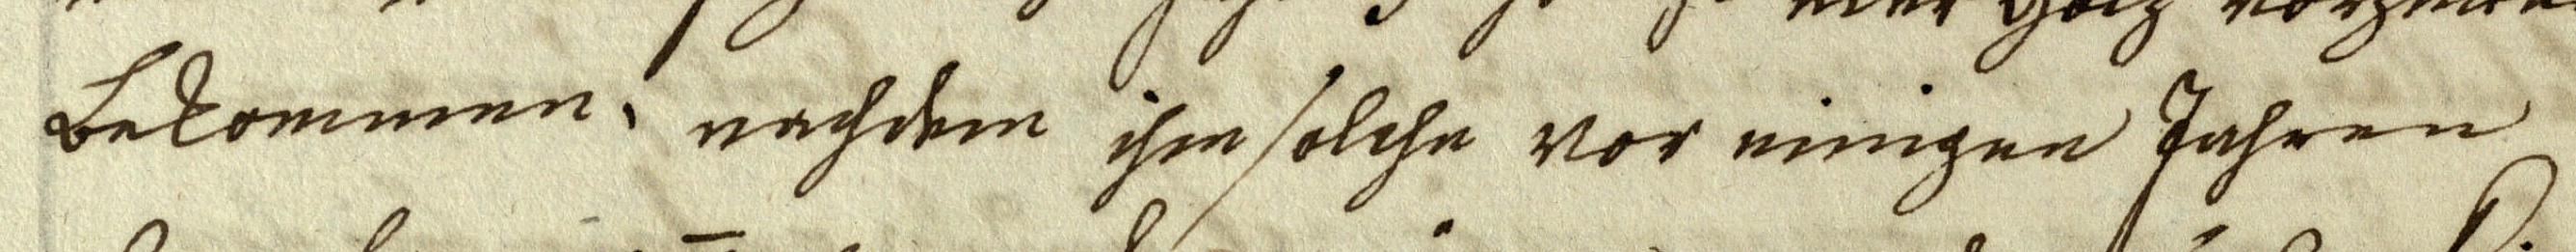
bekommen. nachdem ihm solche vor einigen Jahren
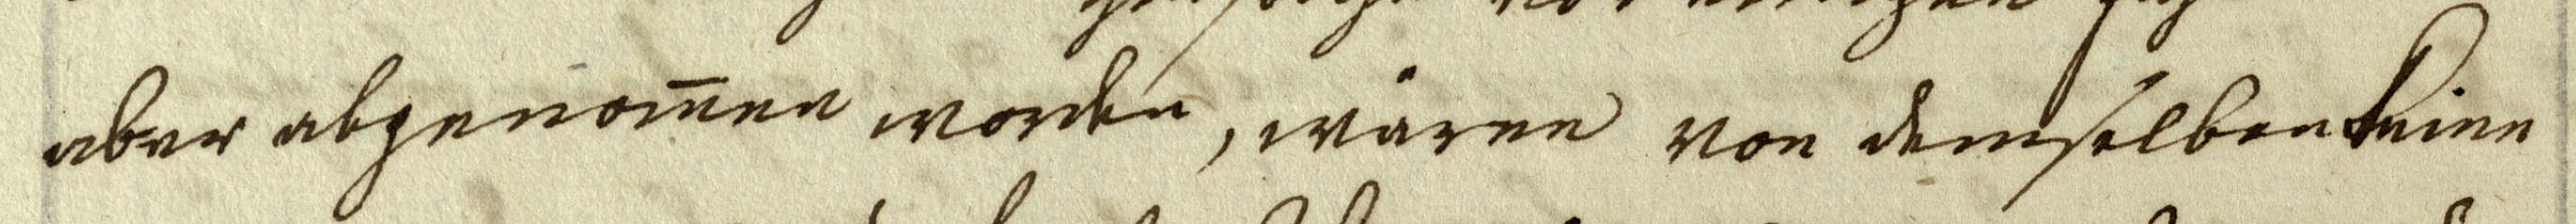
aber abgenomen worden, wäre von demselben keine
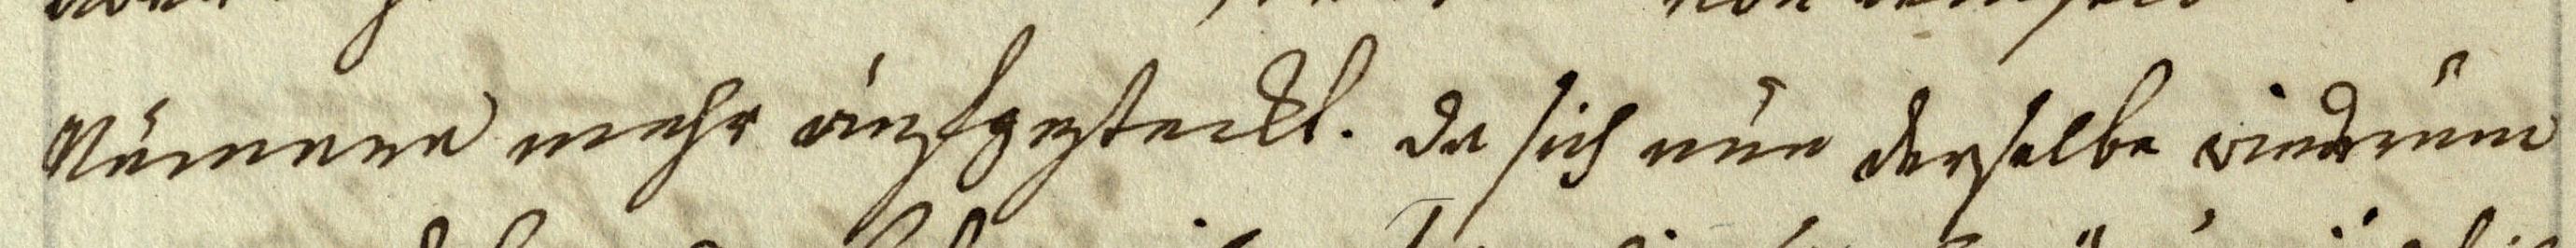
Numern mehr aufgesteckt. da sich nun derselbe wiederum
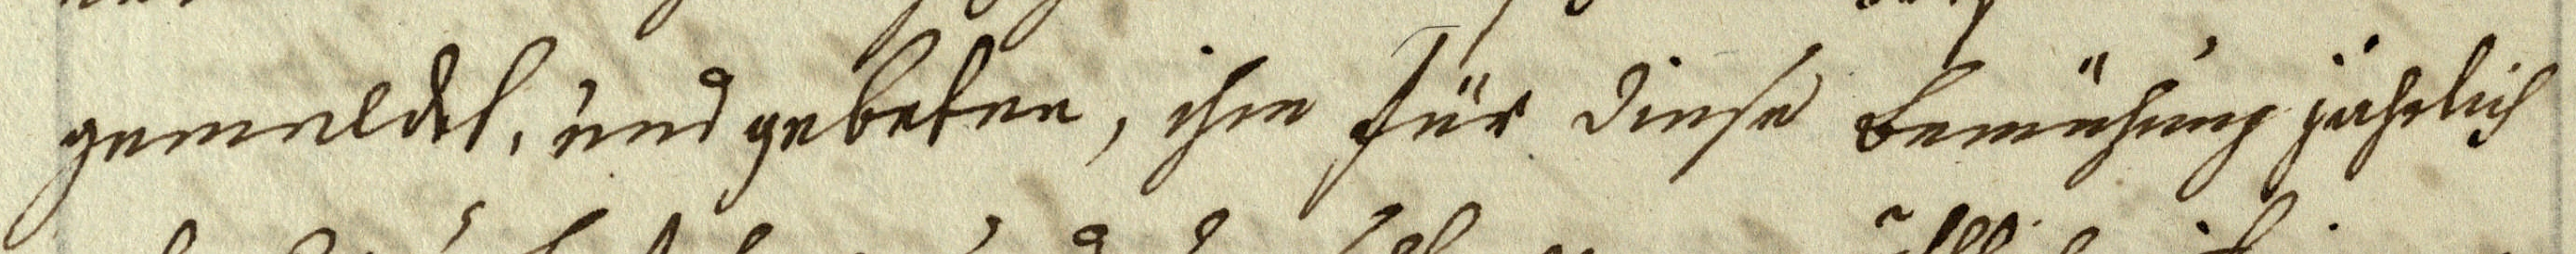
gemeldet, und gebeten, ihm für diese Bemühung jährlich
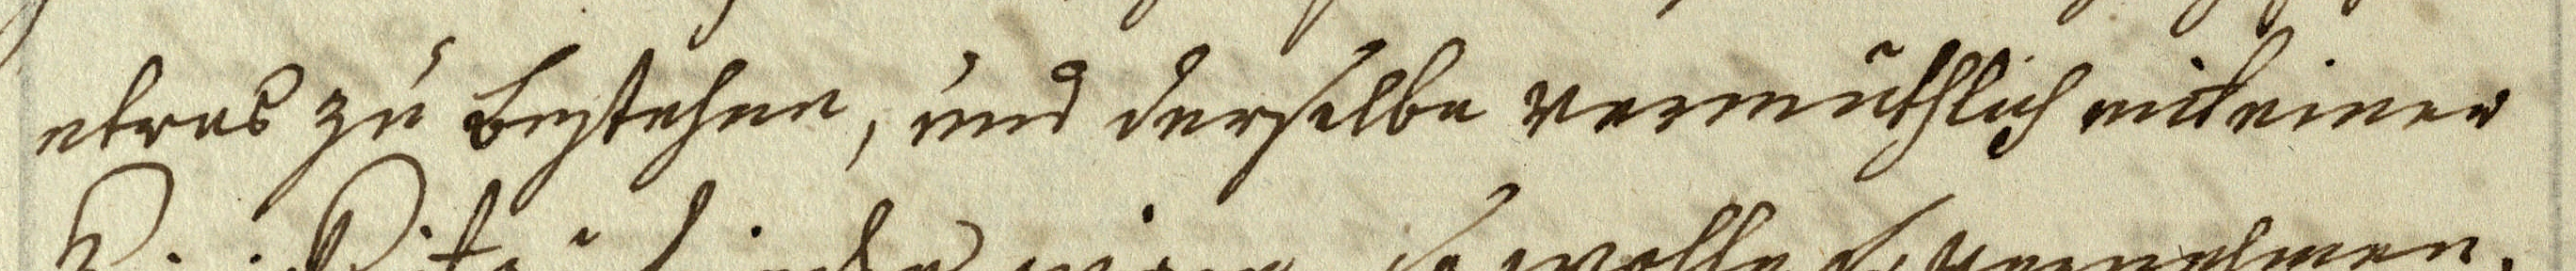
etwas zu bestehen, und derselbe vermuthlich mit einer
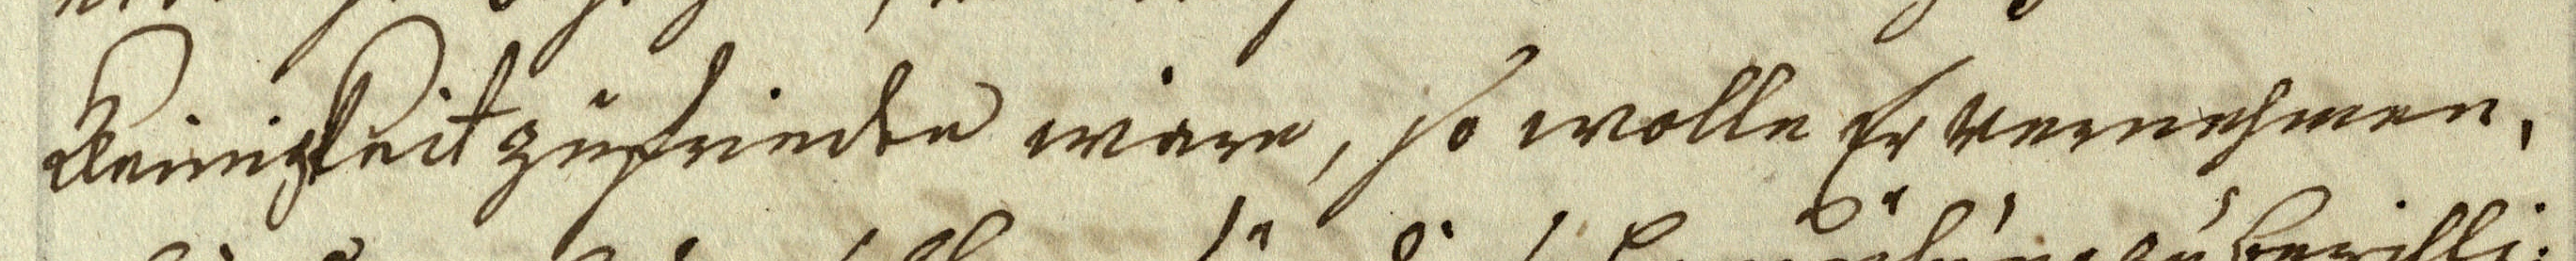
Kleinigkeit zufrieden wäre, so wolle Er vernehmen,
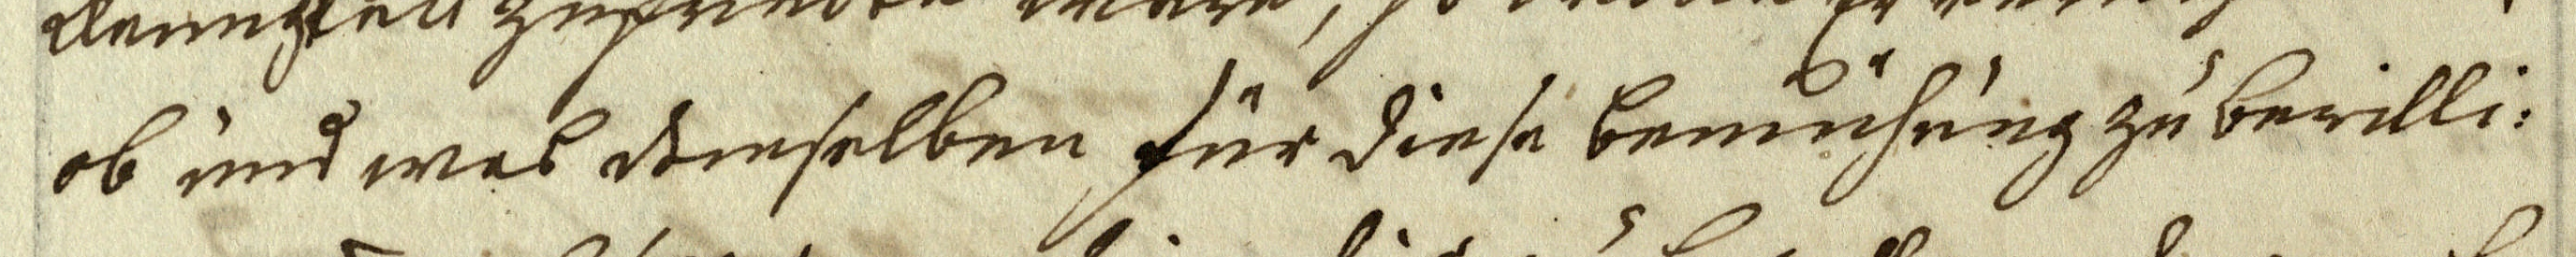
ob und was demselben für diese Bemühunh zu bewilli¬
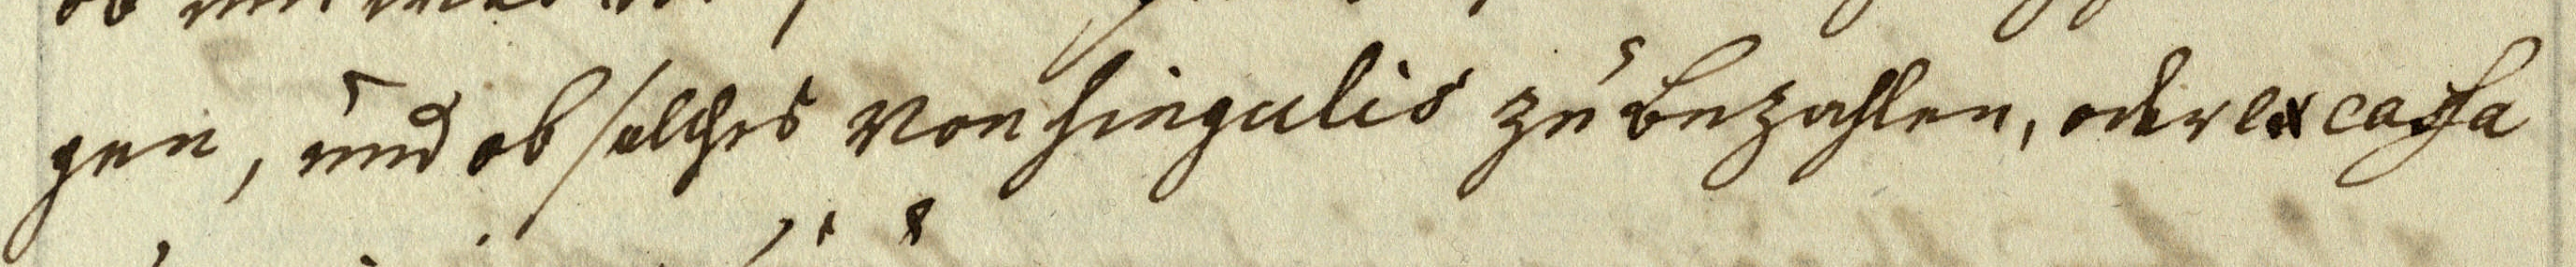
gen, und ob solches von singulis zu bezahlen, oder ex cassa
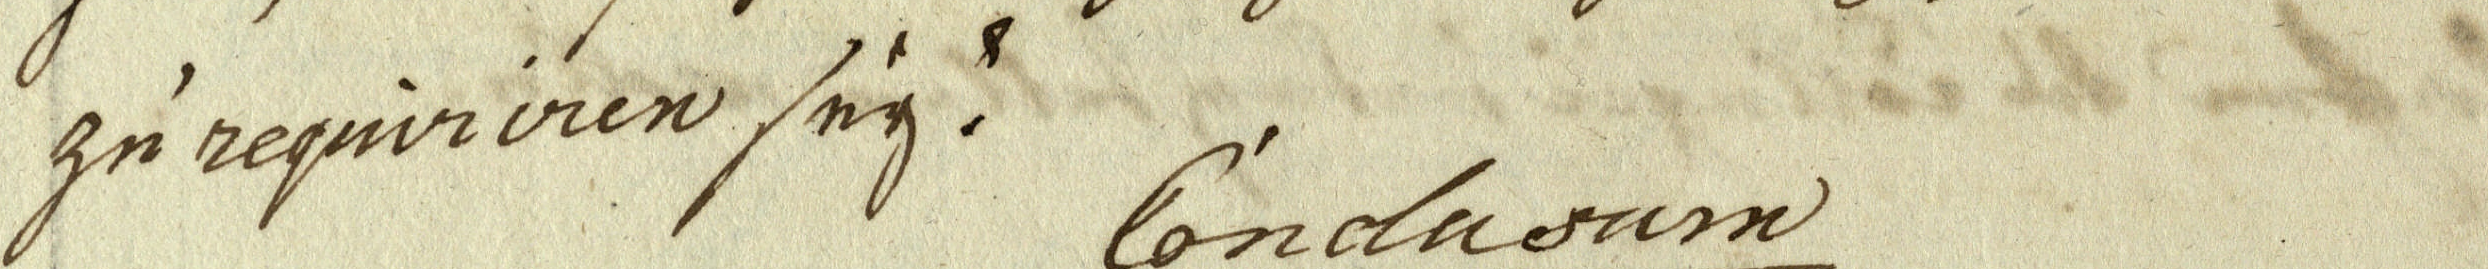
zu requiriren seÿ!
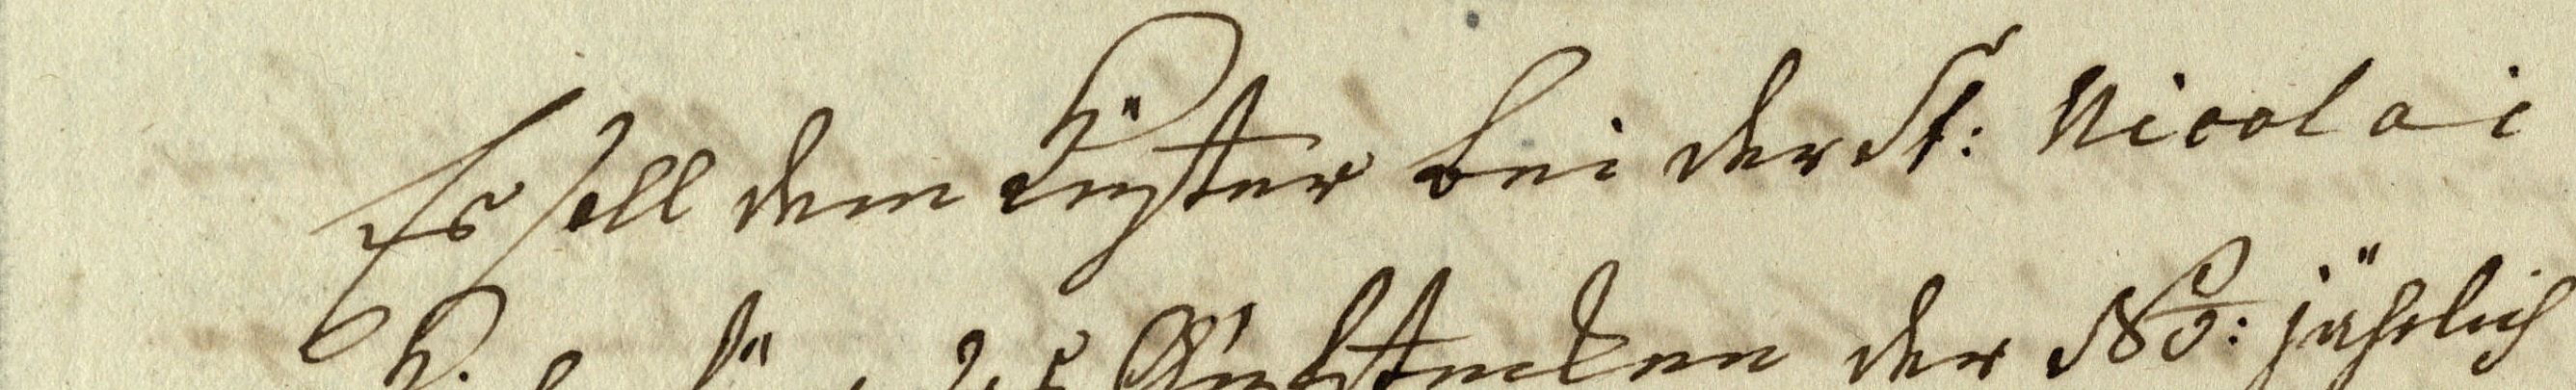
Es soll dem Küster bei der St. Nicolai
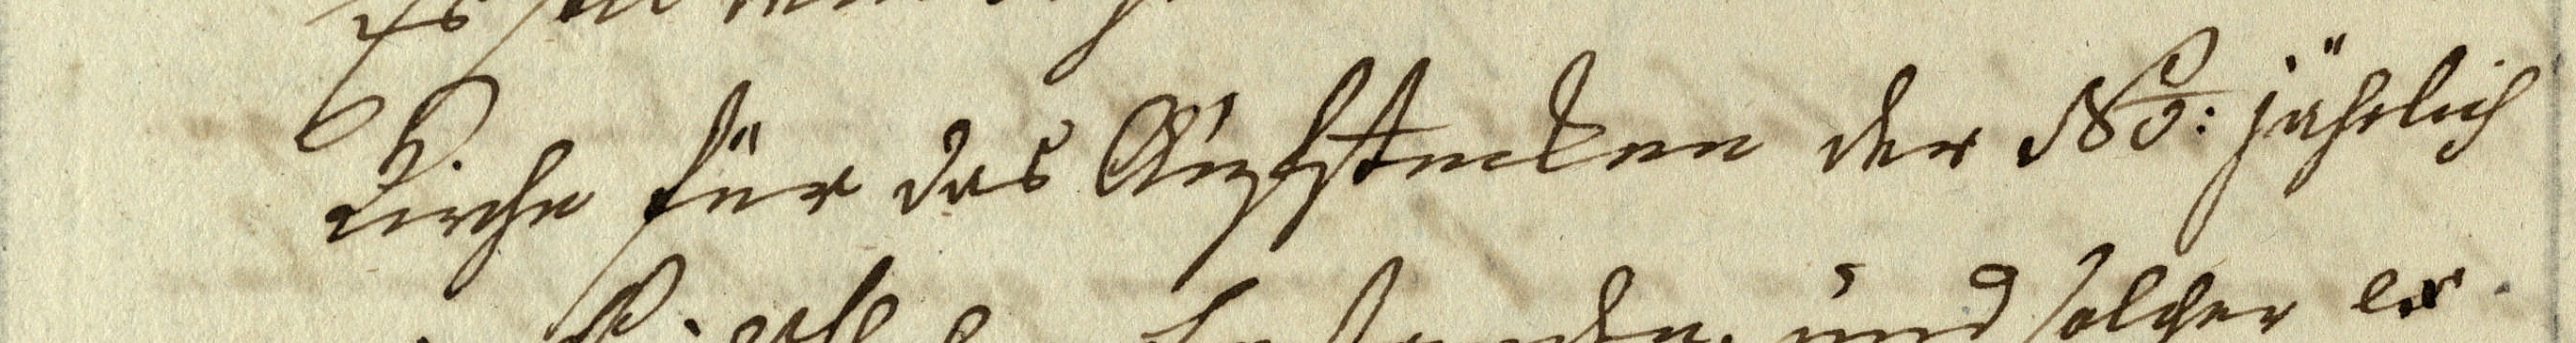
Kirche für sa Aufstecken der No. jährlich
